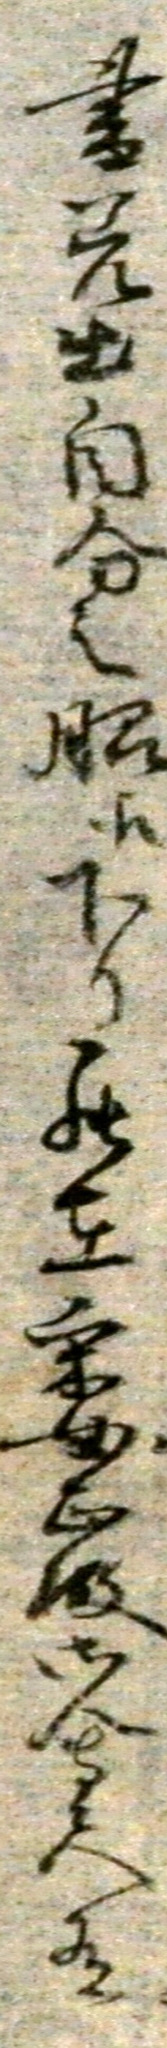書差出自分之脇え下り罷在采女正殿御会尺有
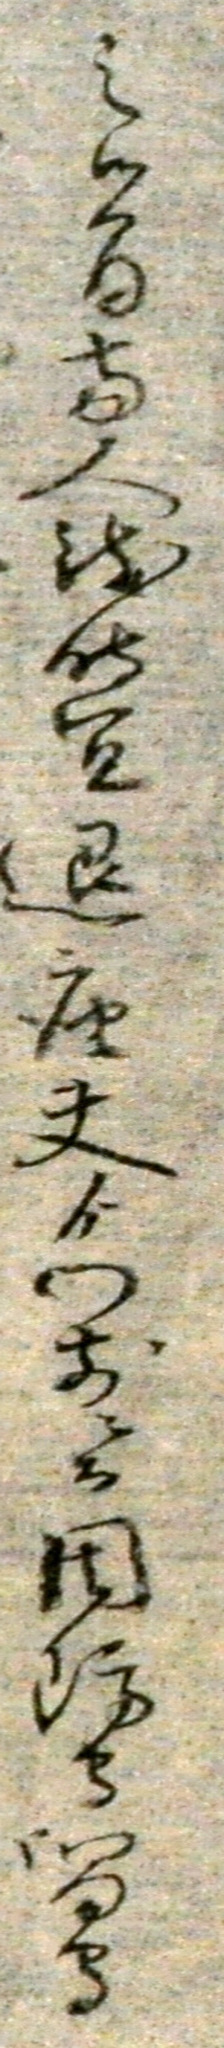之候間両人致時宜退座夫ゟ門前ニ而周防守留守
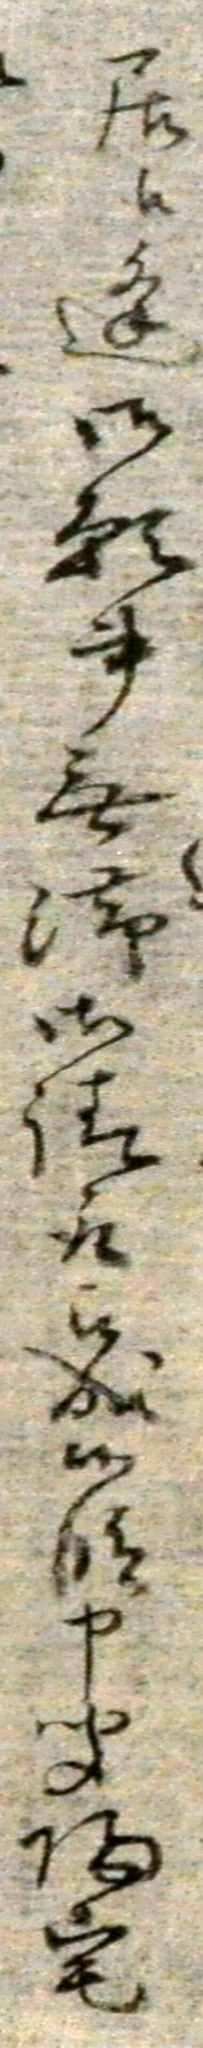居え逢御願書無滞御請取被成候段申聞帰宅
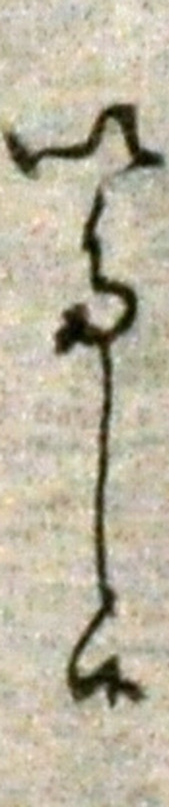いたし候

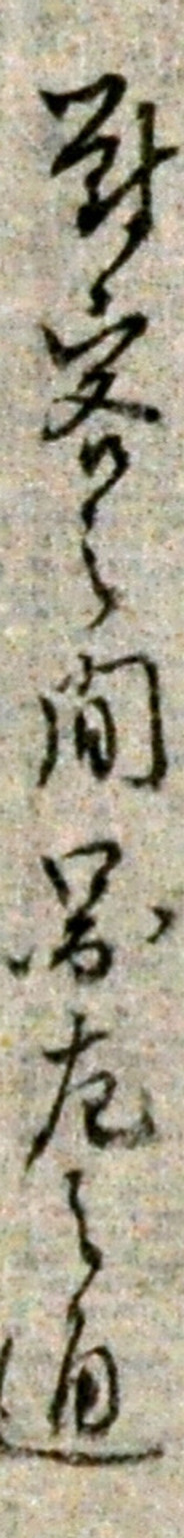対客之間図左之通
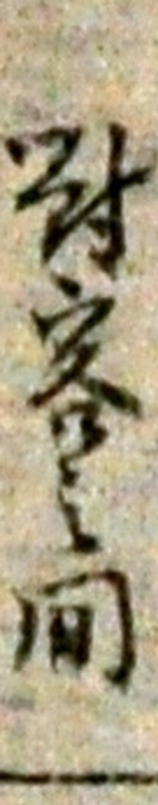対客之間
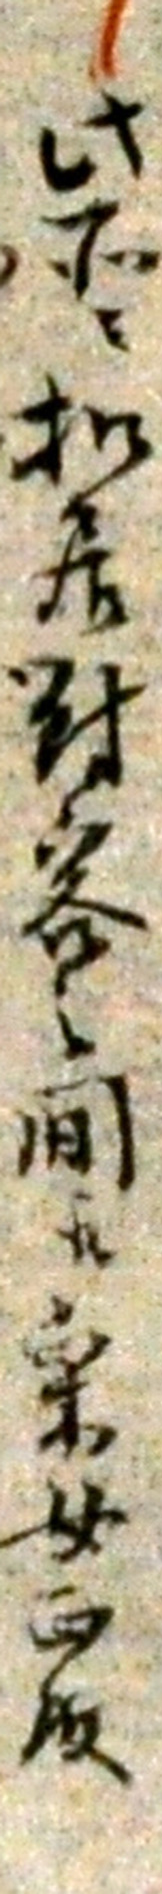此所ニ扣居対客之間え采女正殿
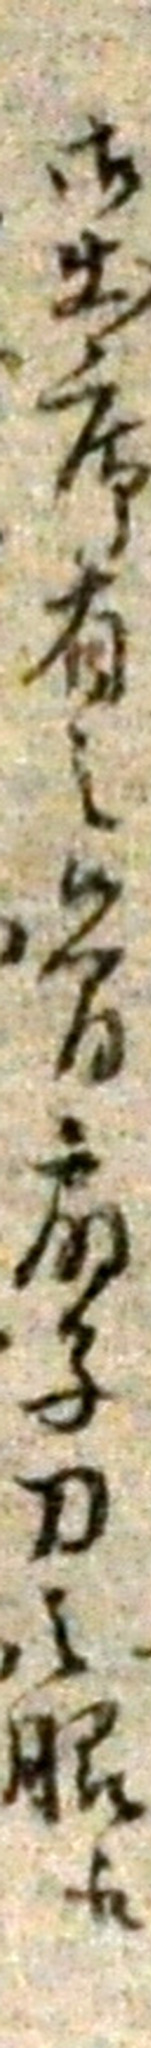御出席有之候間扇子刀之脇え
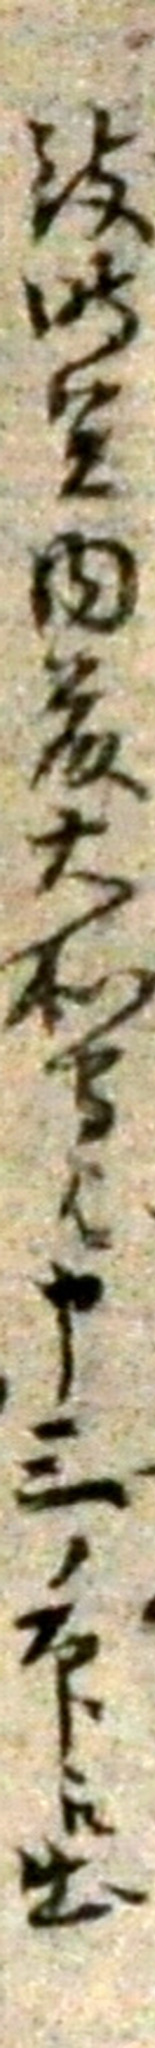致時宜内藤大和守と申三ノ印え出
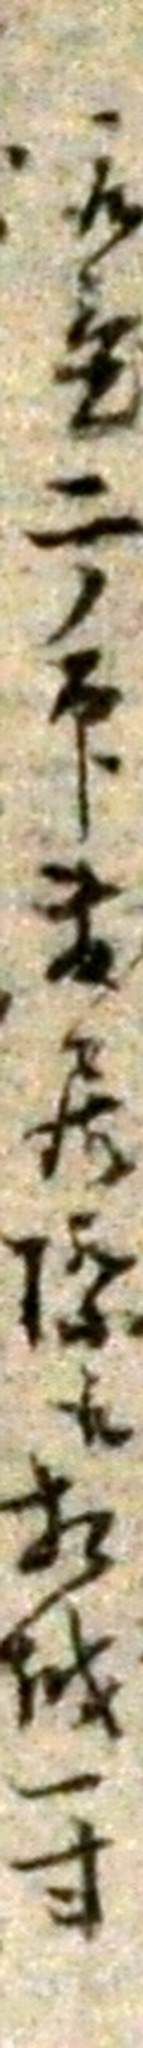取置二ノ印敷居際え相越一寸
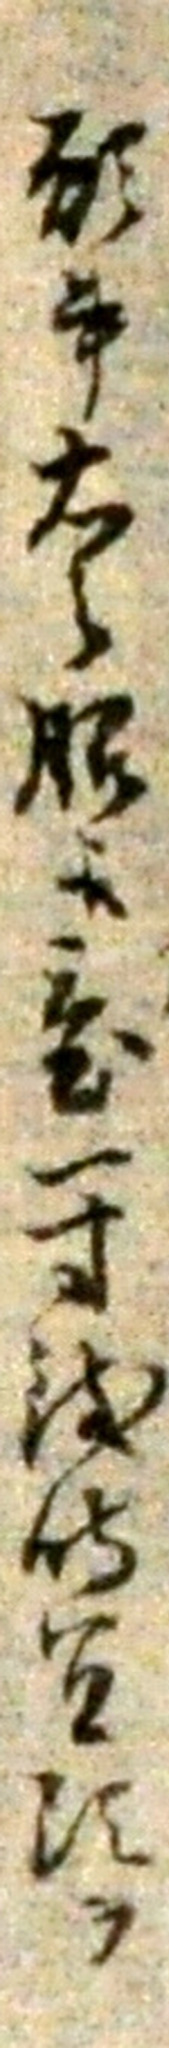願書右之脇え置一寸致時宜頭ヲ
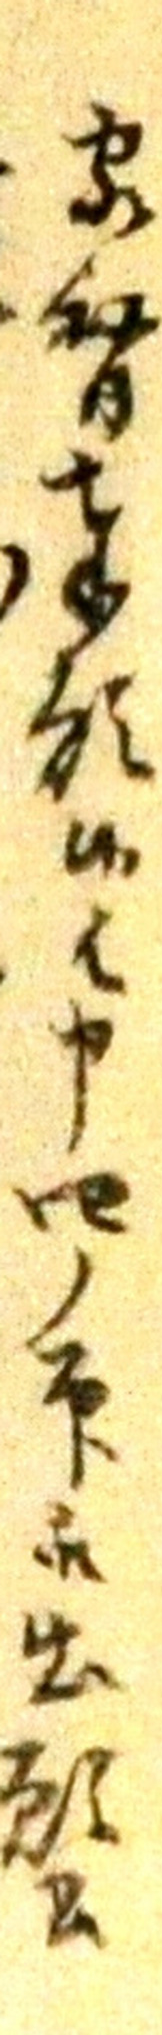家督奉願候と申四ノ印え出願書
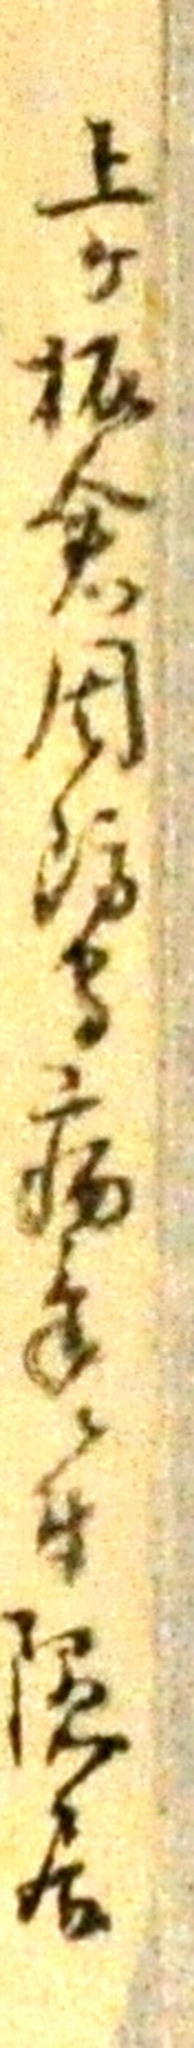上ケ板倉周防守病気ニ付隠居
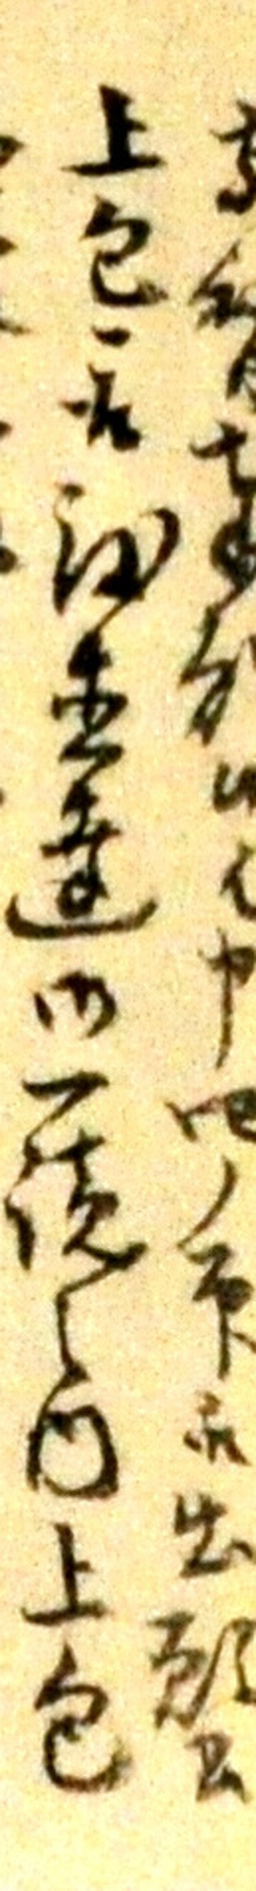上包取致直達御一読之内上包
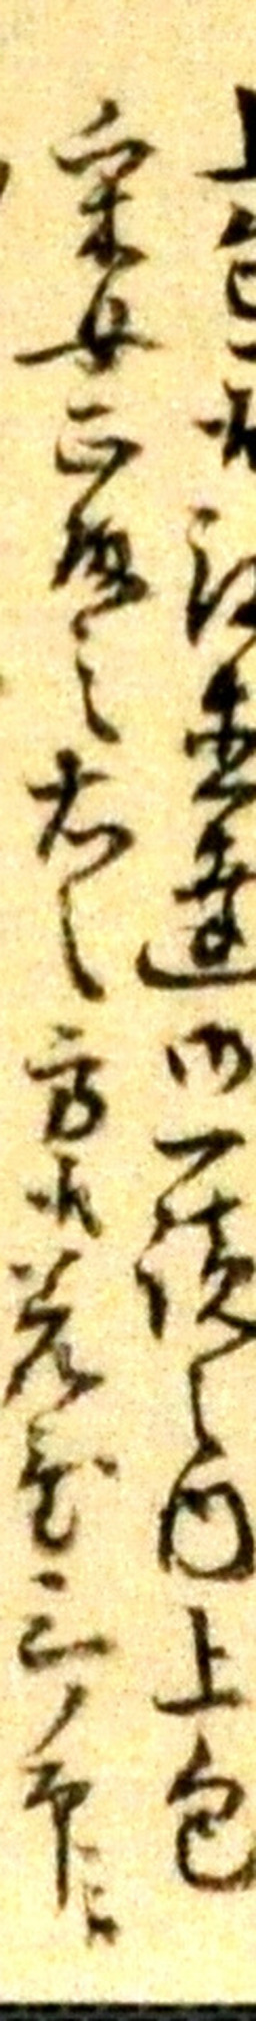采女正殿之右之方え差置三ノ印え
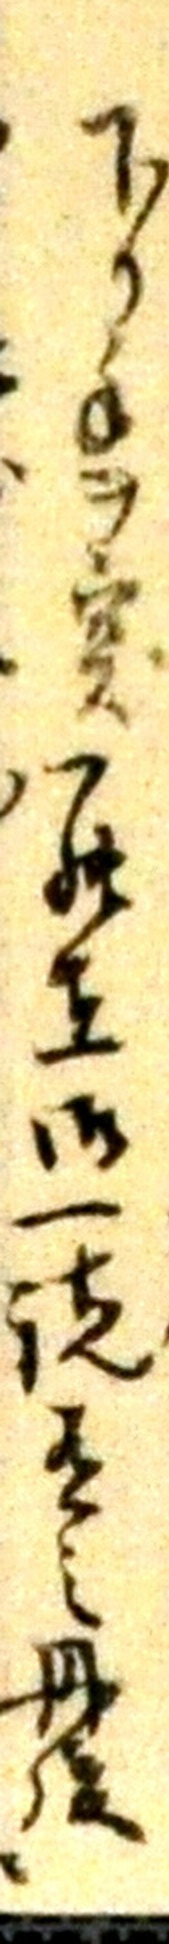下り手ヲ突罷在御一読有之丹後
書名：諸名代相勤候節ノ留書外
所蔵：伊那市立高遠町図書館・合同会社AMANE
